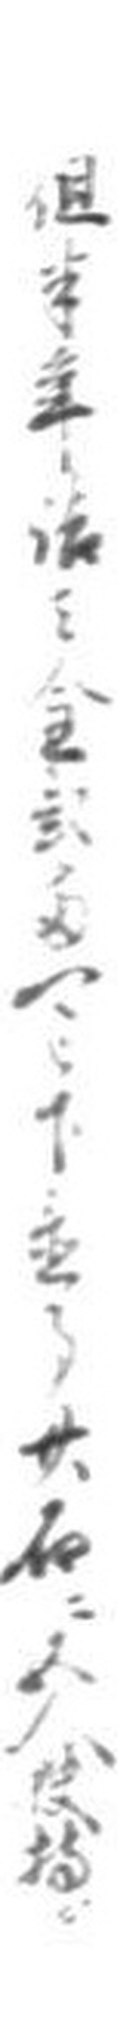但半年之詰者金弐両可被下置事廿石ニ五人扶持
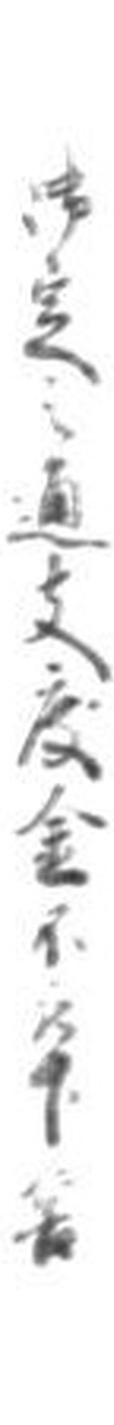御定之通支度金不被下筈
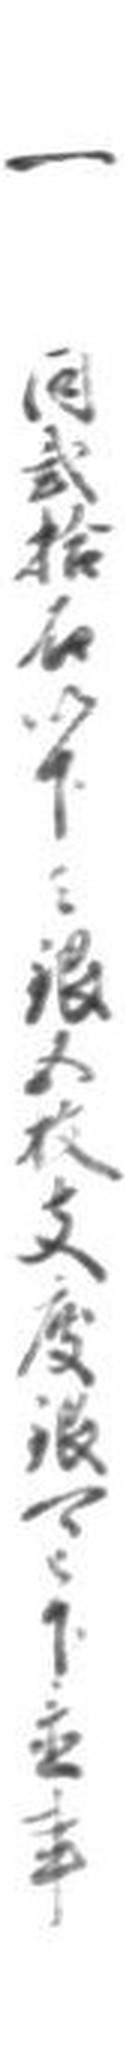一同弐拾石以下者銀五枚支度銀可被下置事

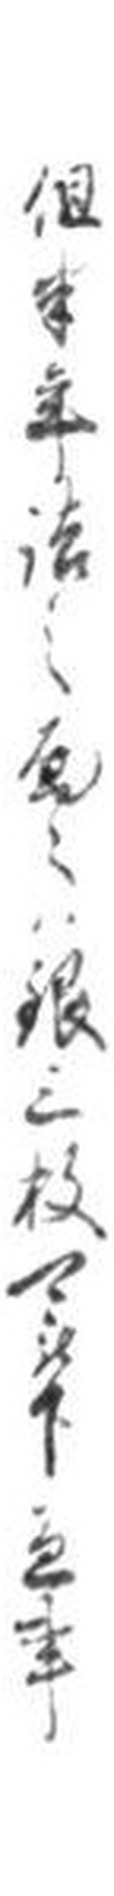但半年詰之面々ハ銀三枚可被下置事
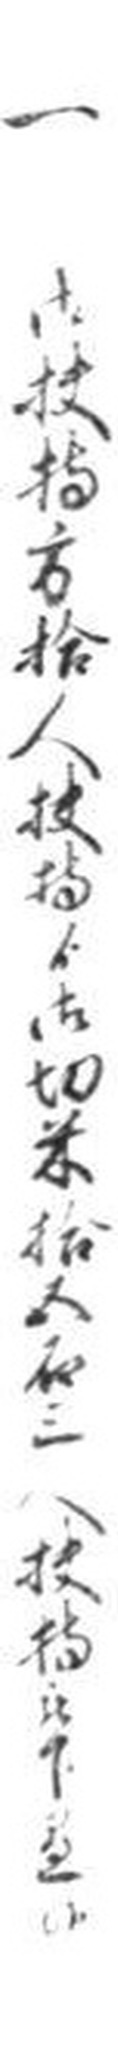一御扶持方拾人扶持ゟ御切米拾五石三人扶持被下置候
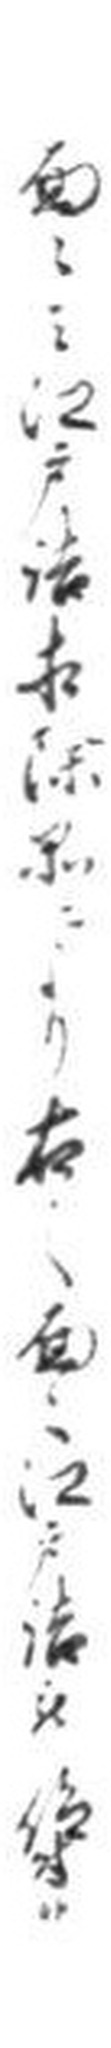面々者江戸詰相除品ニより右之面々江戸詰被仰付候
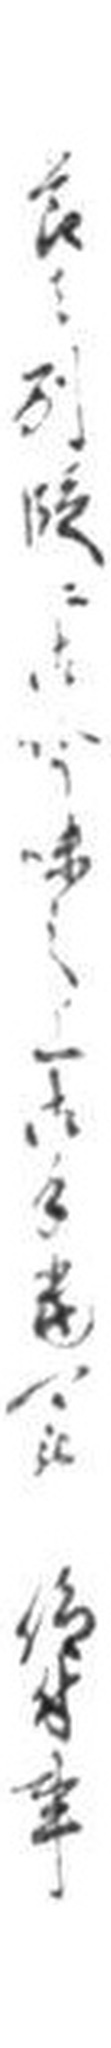節者別段ニ御吟味之上御手当可被仰付事
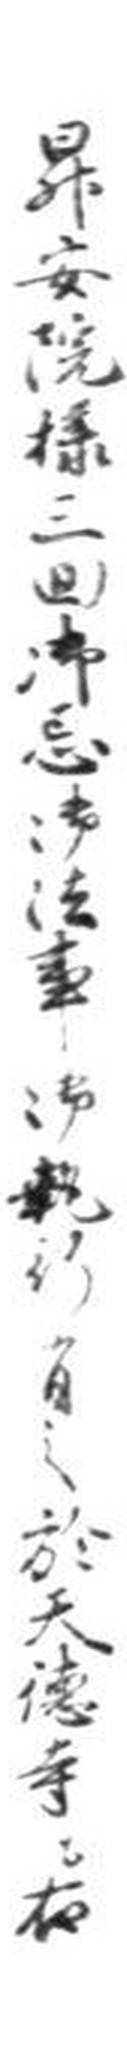昇安院様三回御忌御法事御執行有之於天徳寺も右
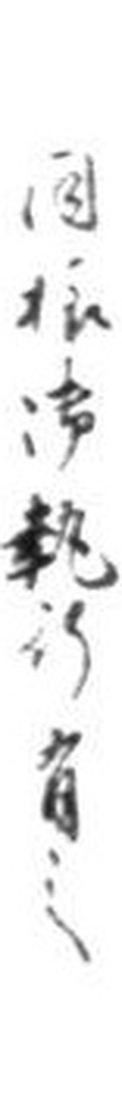同様御執行有之
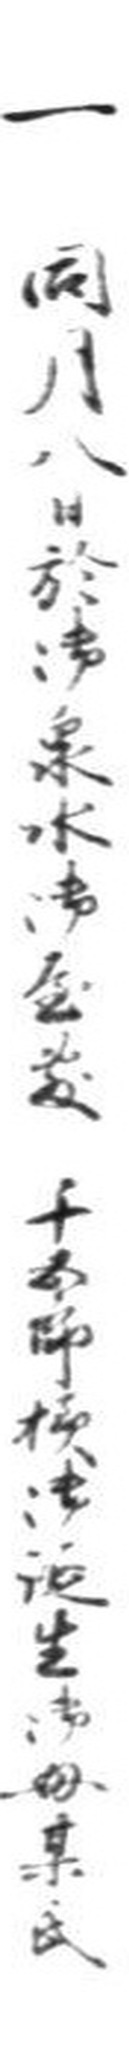一同月八日於御泉水御屋敷千五郎様御誕生御母某氏
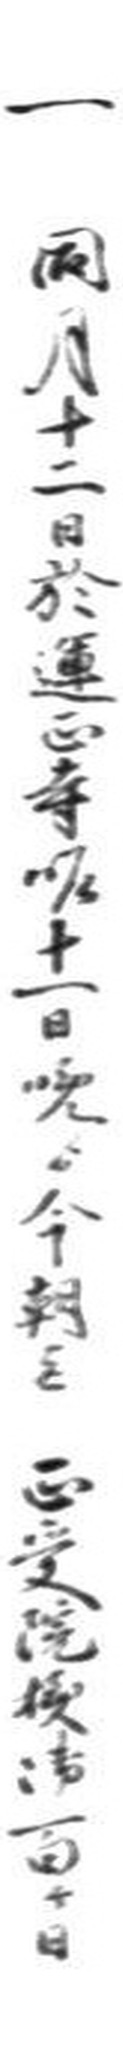一同月十二日於運正寺昨十一日晩ゟ今朝迄正受院様御百ケ日
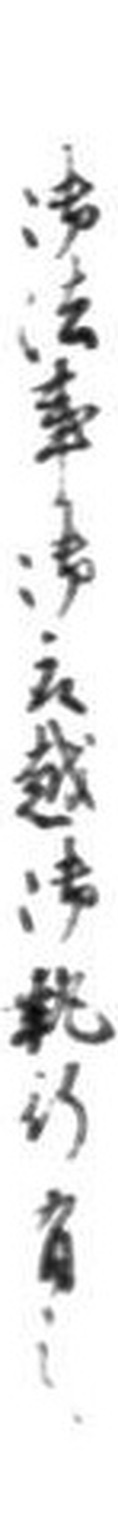御法事御取越御執行有之
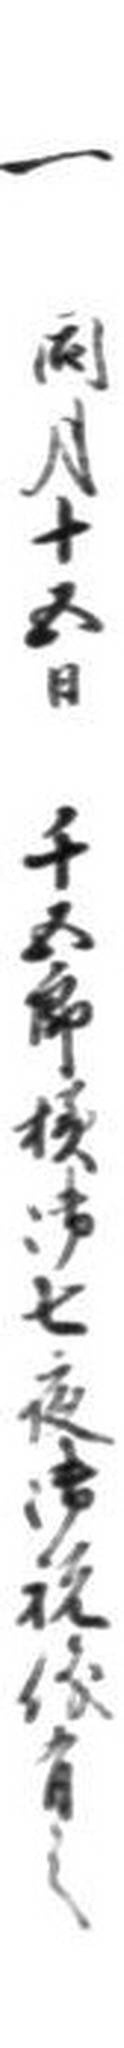一同月十五日千五郎様御七夜御祝儀有之
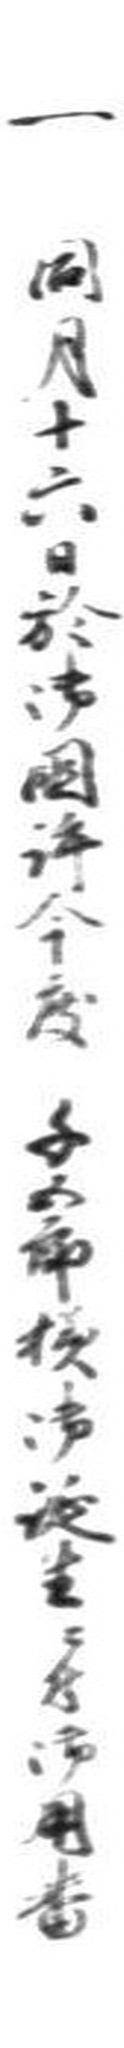一同月十六日於御国許今度千五郎様御誕生ニ付御用番
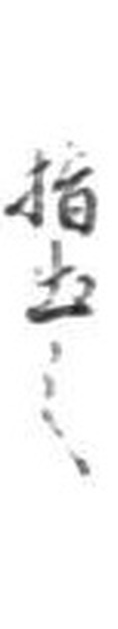指出之
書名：家譜 三十六 宗昌公 従享保八年到同九年
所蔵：福井県文書館 Fukui Prefectural Archives
